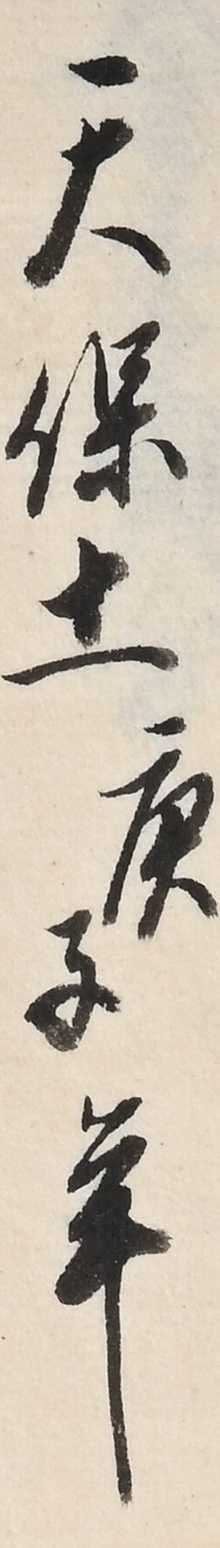天保十一庚子年
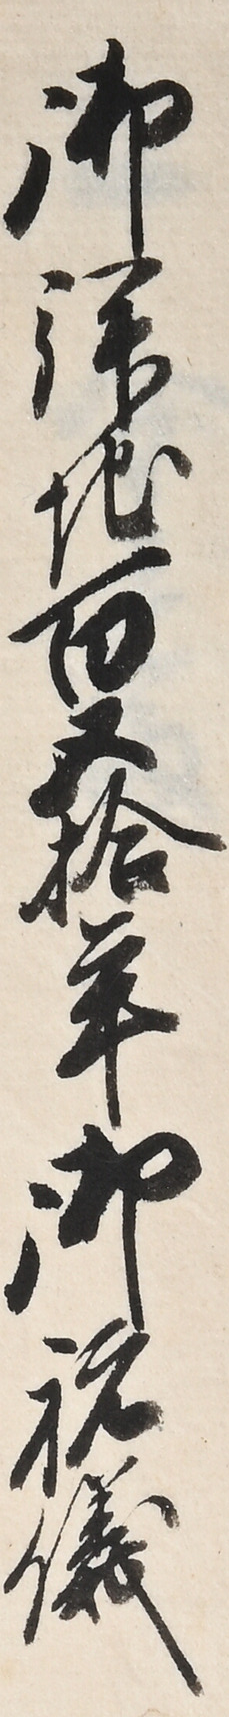御拝地百五拾年御祝儀
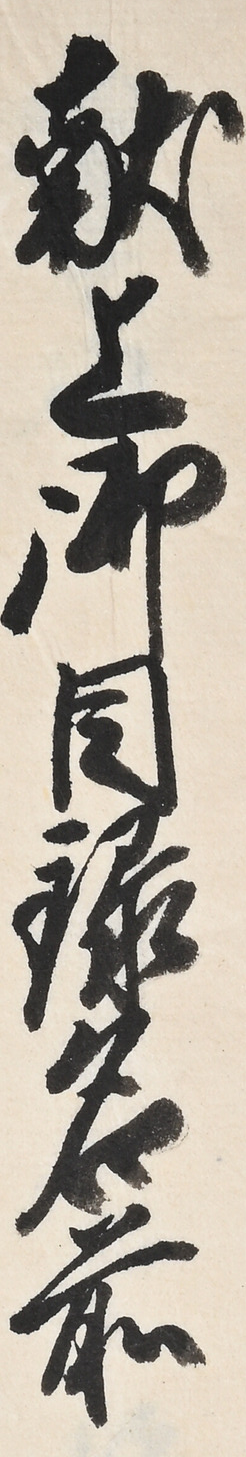献上御目録名前
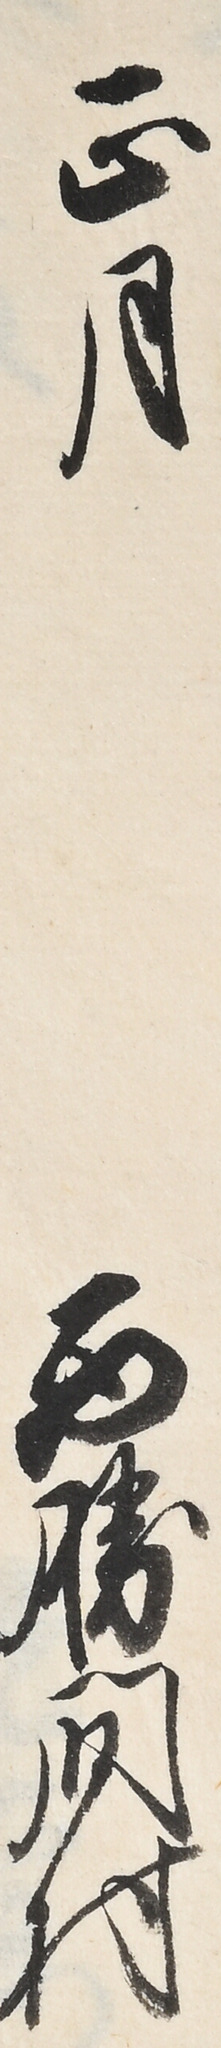正月西勝間村

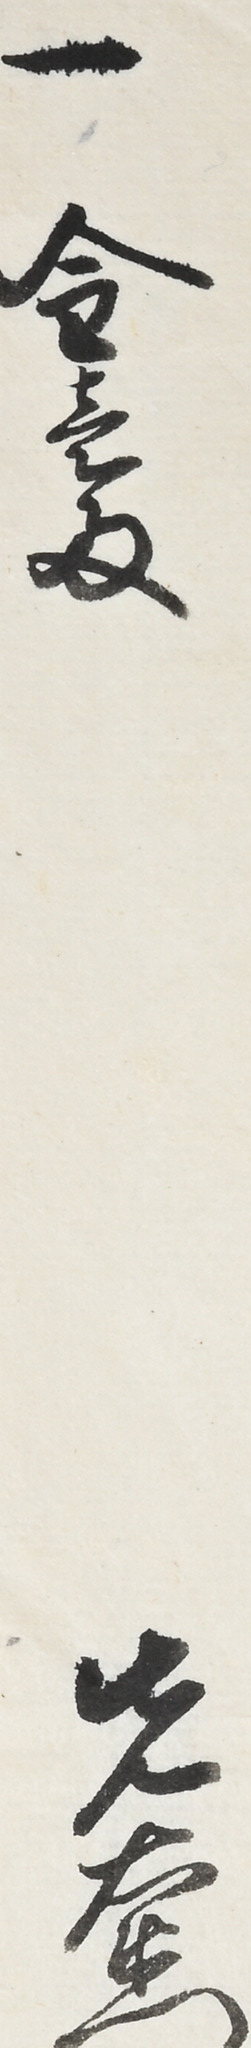一金壱両新右衛門

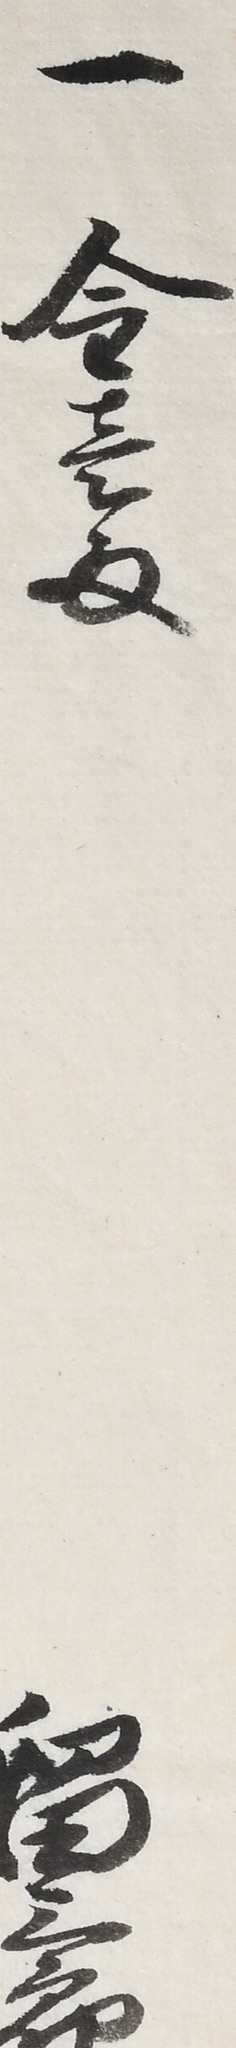一金壱両留三郎
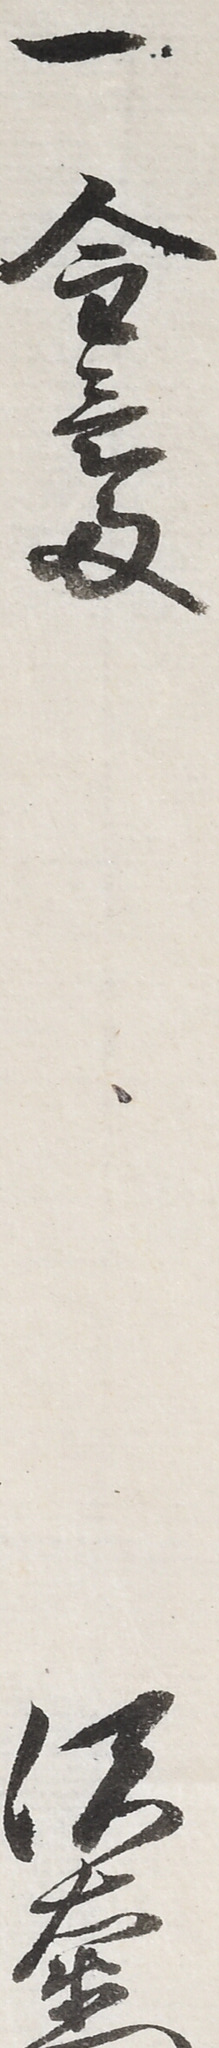一金壱両沢右衛門
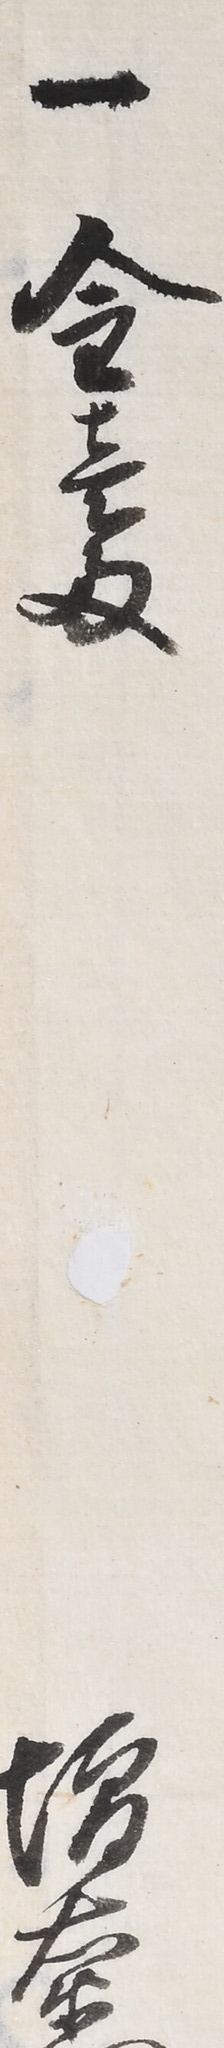一金壱両東治
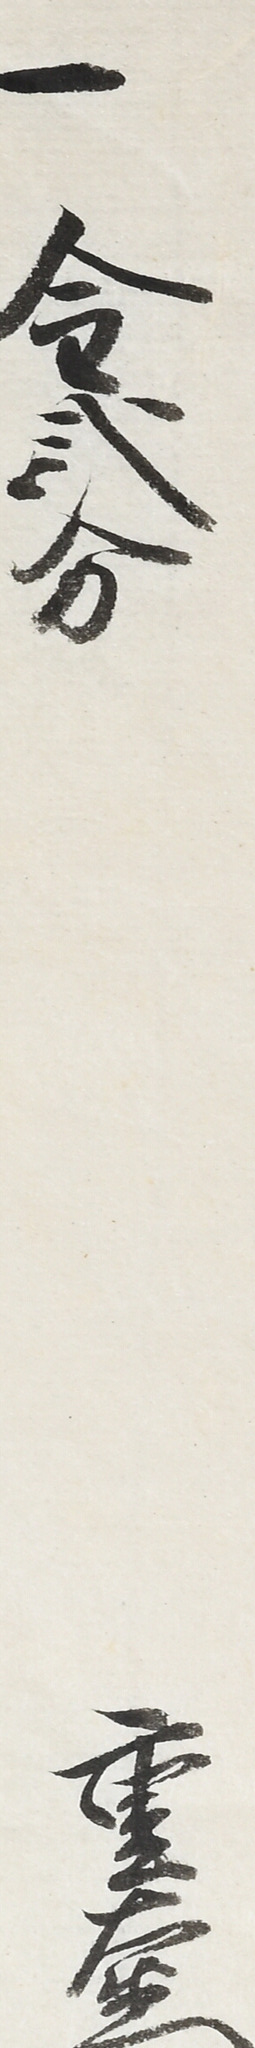一金弐分重右衛門
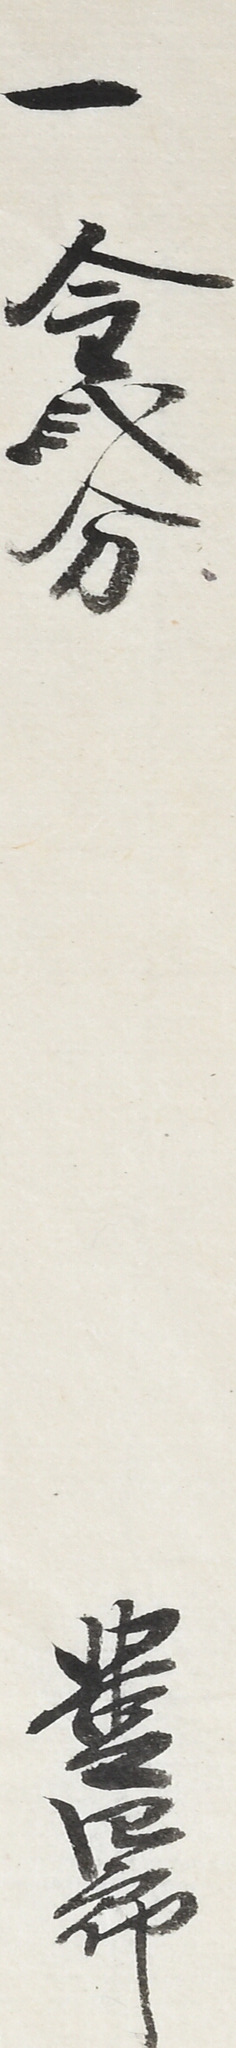一金弐分豊四郎

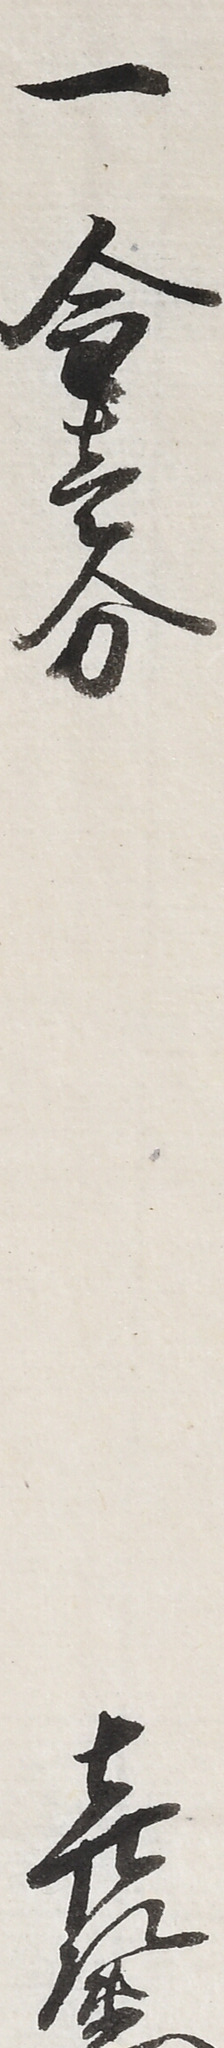一金壱分喜左衛門
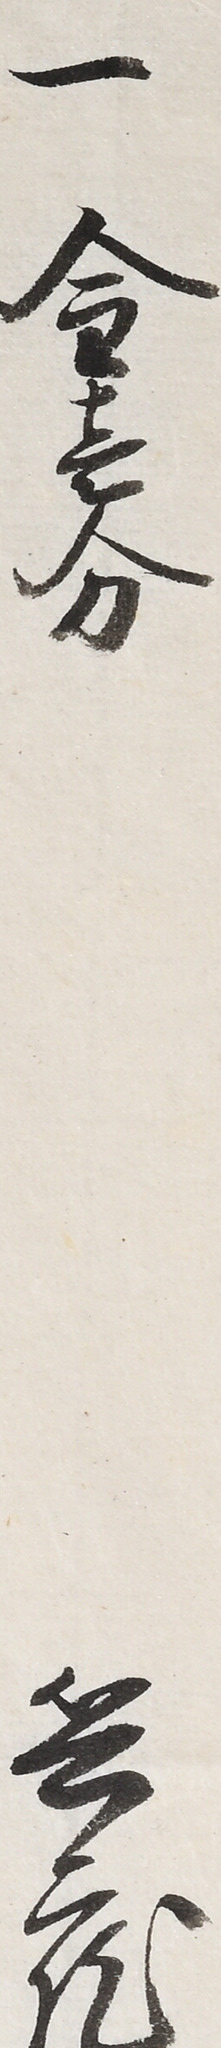一金壱分兵蔵
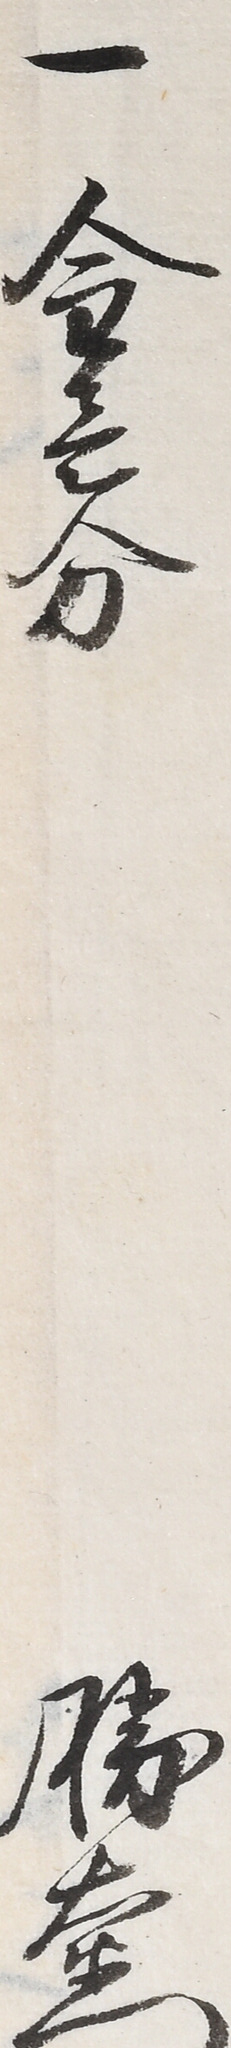一金壱分勝右衛門
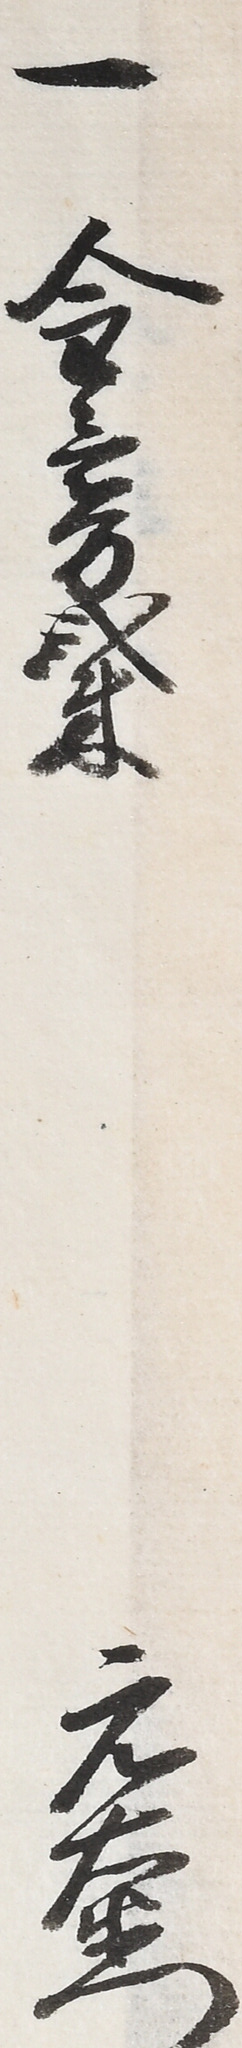一金壱分弐朱元右衛門
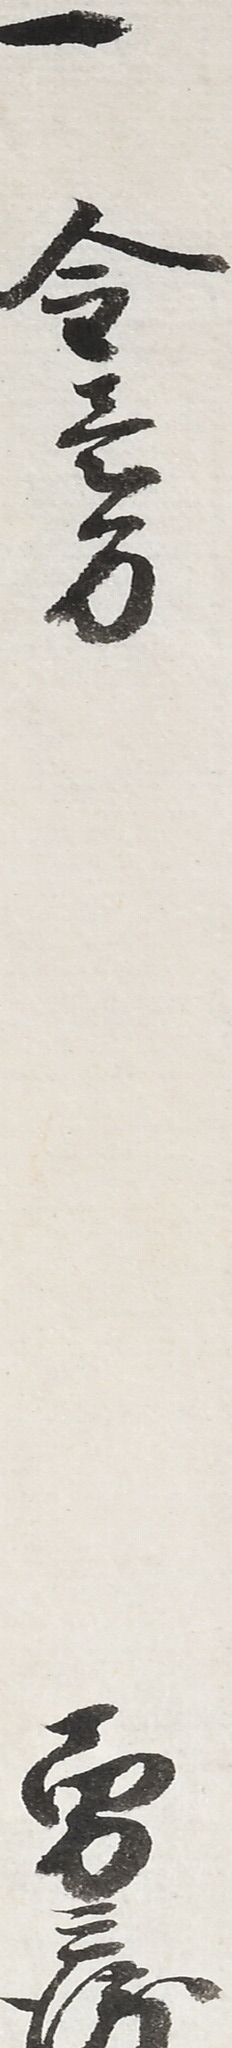一金壱分勇兵衛母
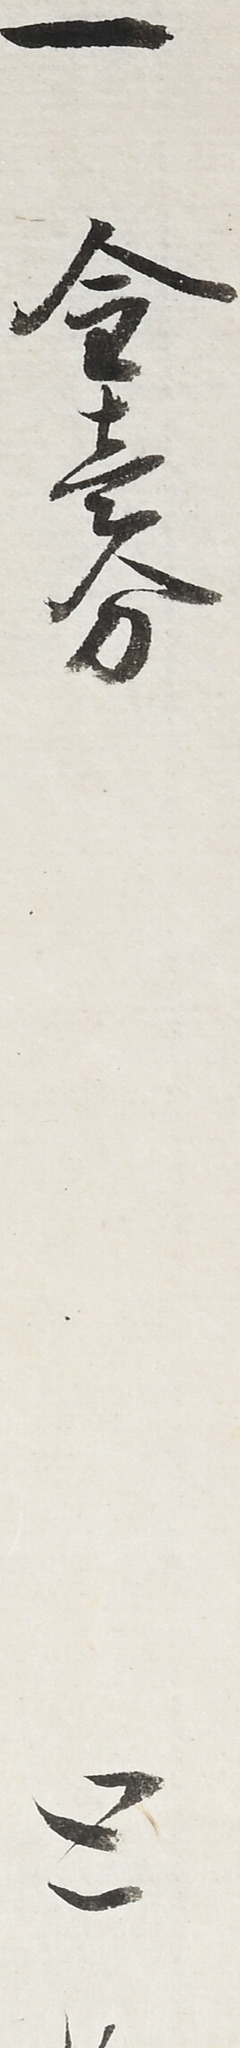一金壱分兵蔵
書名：御拝地百五拾年御祝儀献上御目録名前
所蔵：伊那市立高遠町図書館・合同会社AMANE
